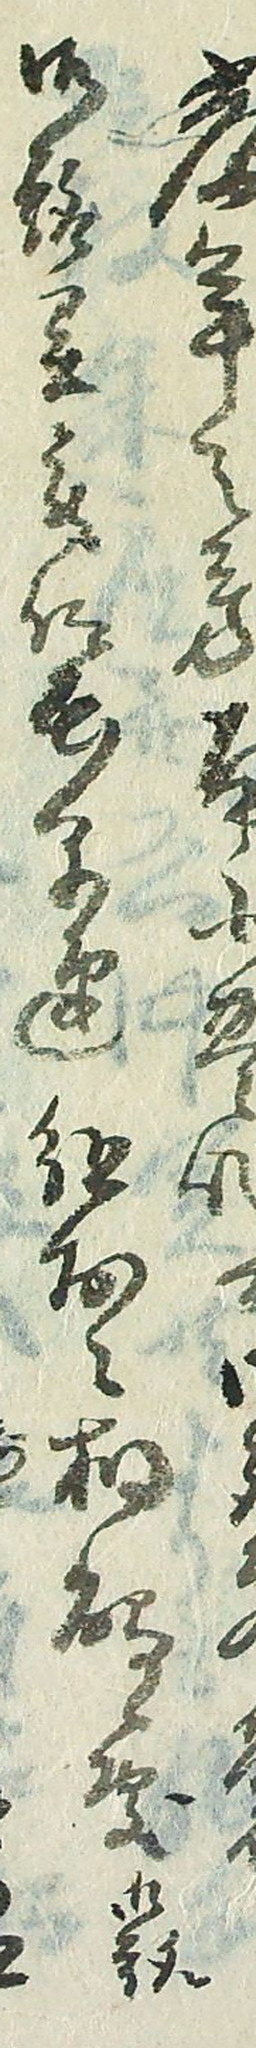御趣異被仰出早速組村々相触候処御趣
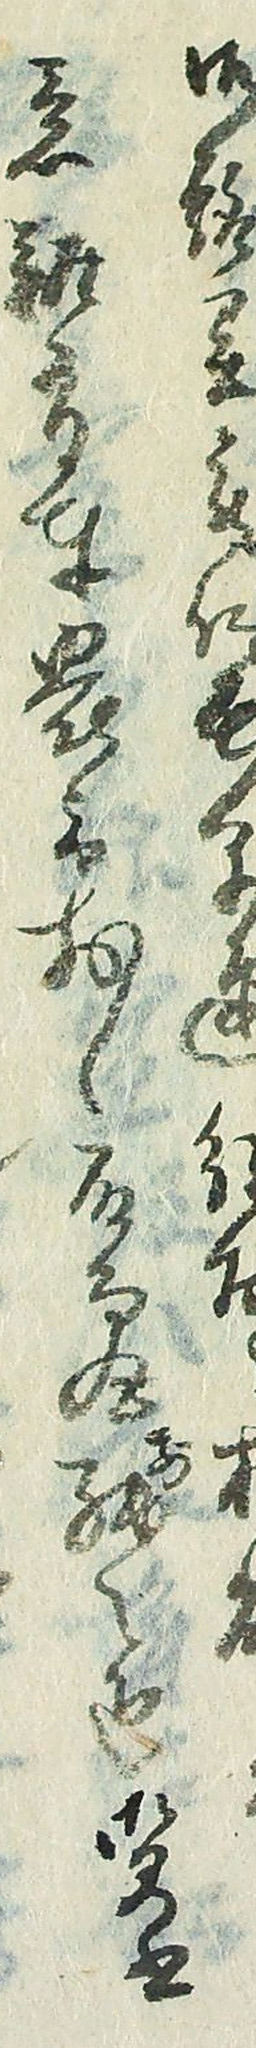意難有奉畏旨村々取究別紙之通御受書
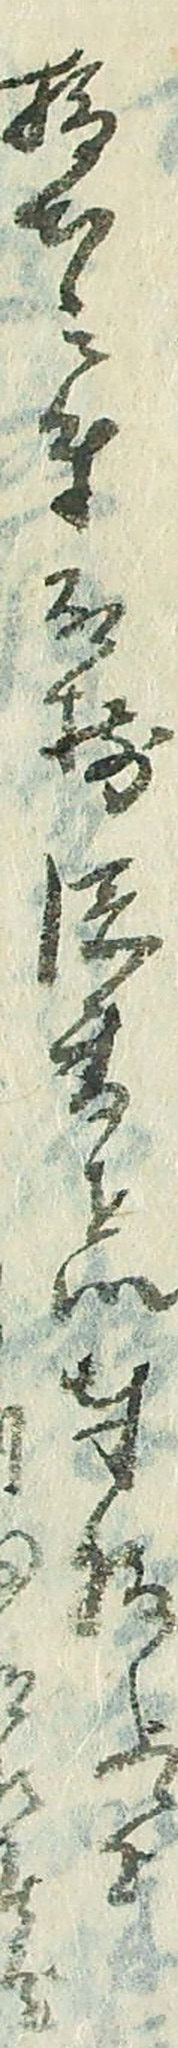指出候に付取揃添書を以奉指上候以上
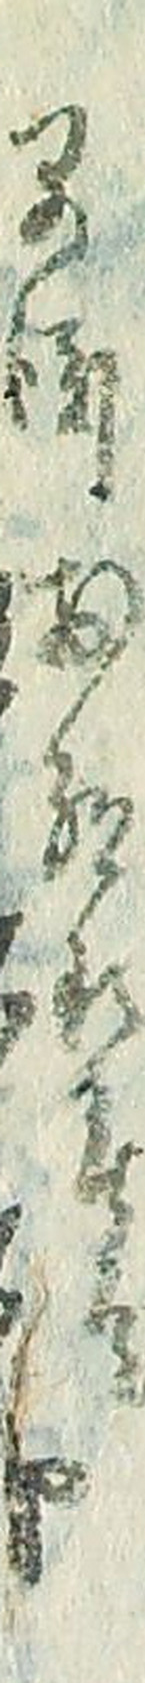早淵村与頭庄屋
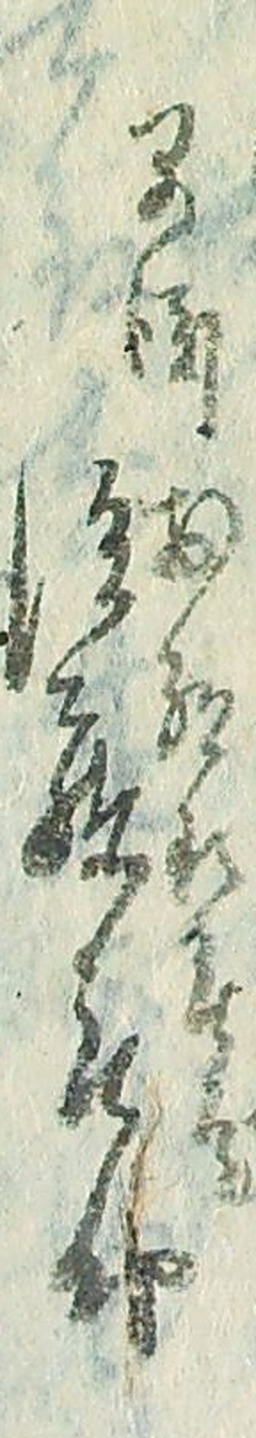後藤庄助
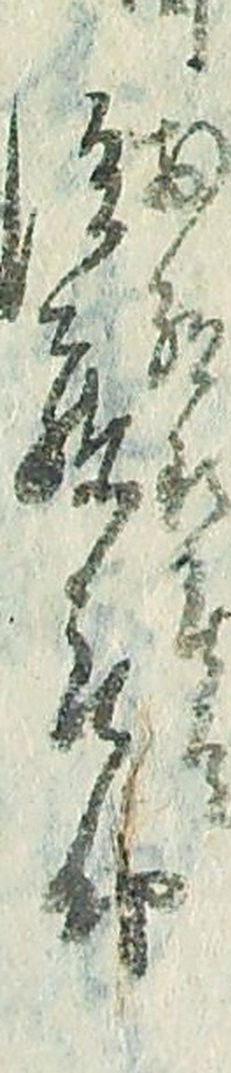後藤庄助
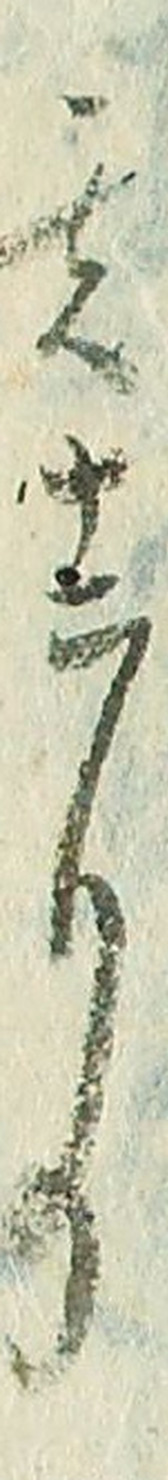亥十二月

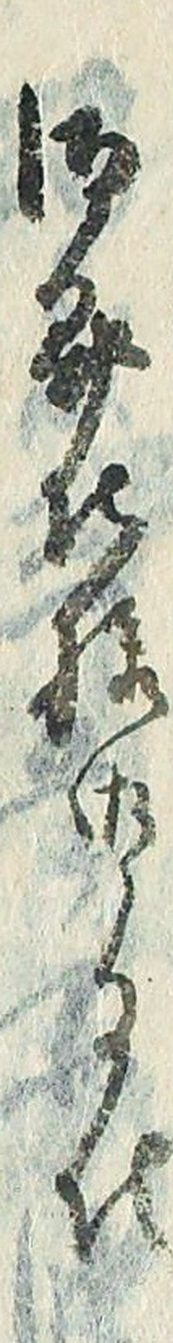御郡代様御手代
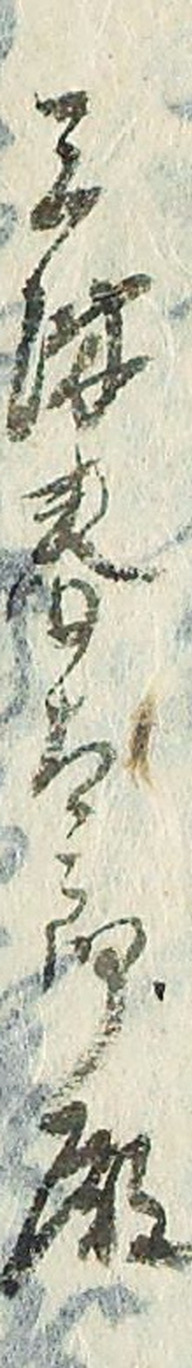三沢春太郎殿
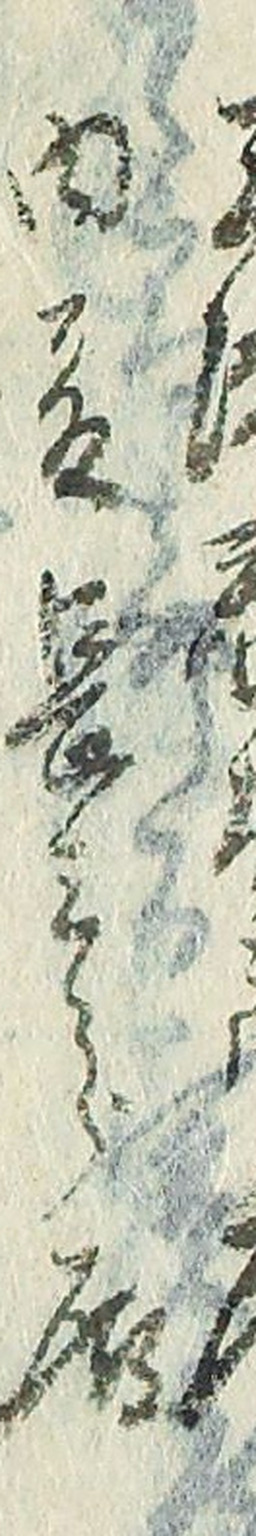内藤長三郎殿
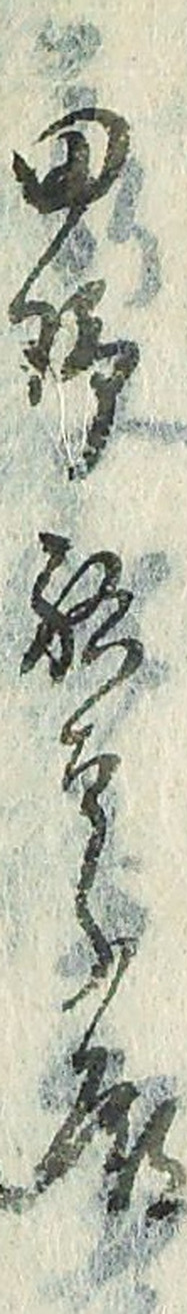田野祐太郎殿
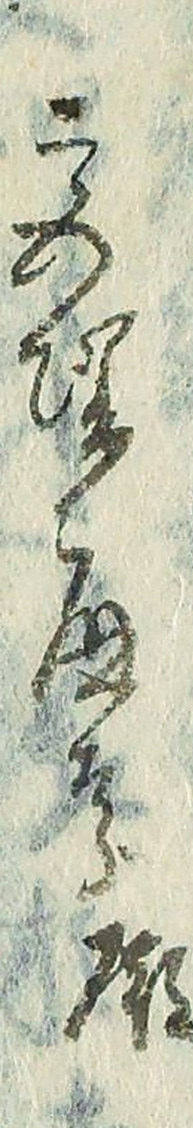宮城麻太郎殿
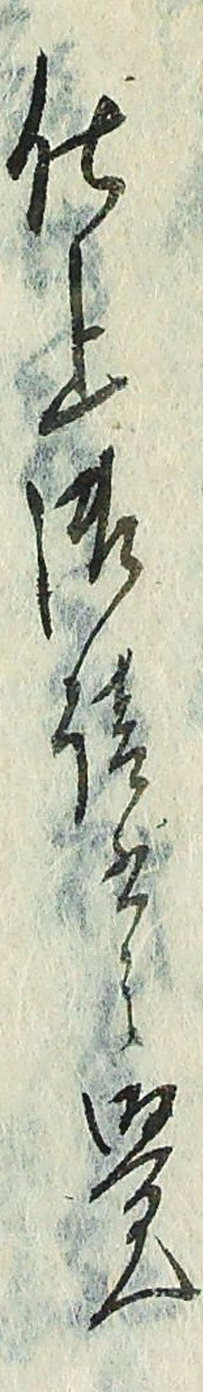仕上御請書之覚
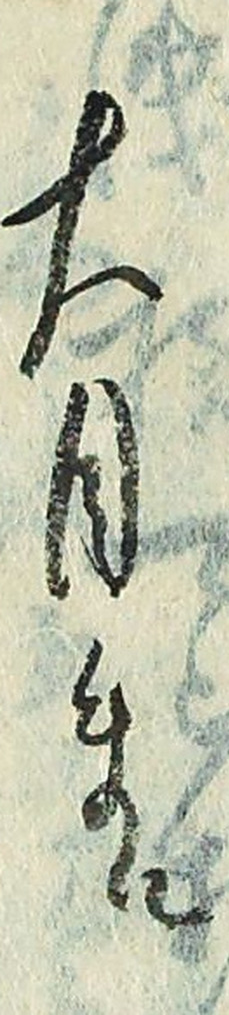大目付江
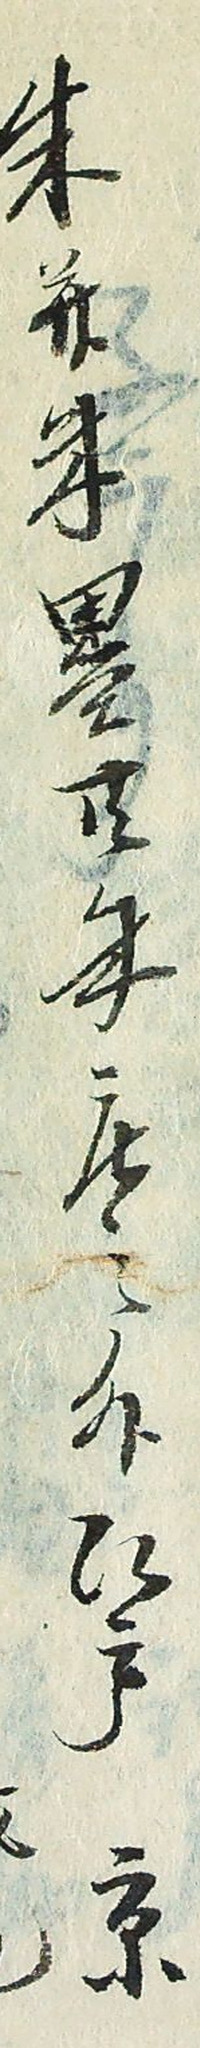朱幷朱墨共朱座之外江戸京
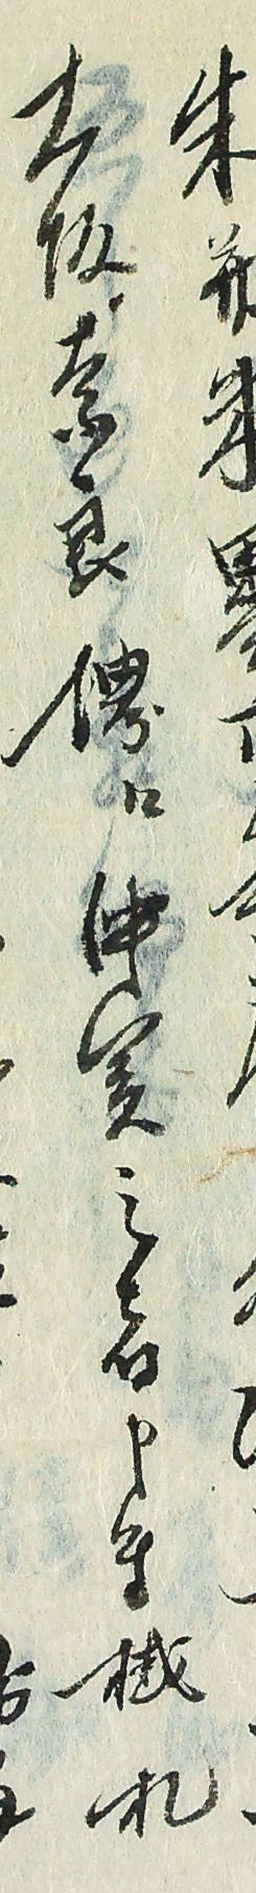大坂奈良堺江仲買之者申付掛札
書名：諸御用御□受書控
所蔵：鳴門教育大学 Naruto University of Education
